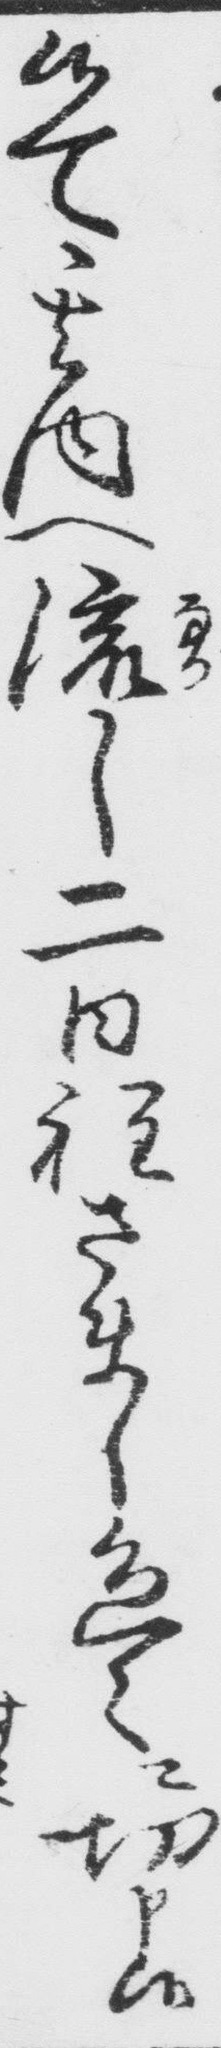候て其内へ流し二日程さまし色々に切申候
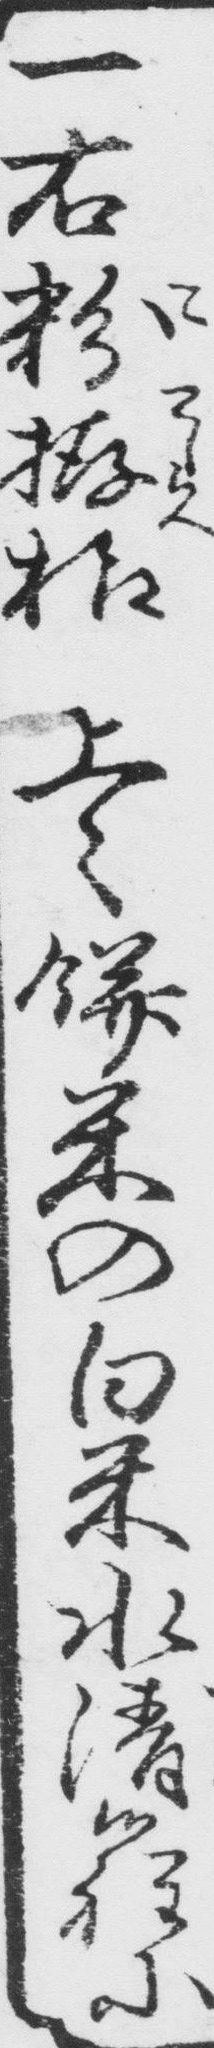一右粉拵様上々餅米の白米水清候程に

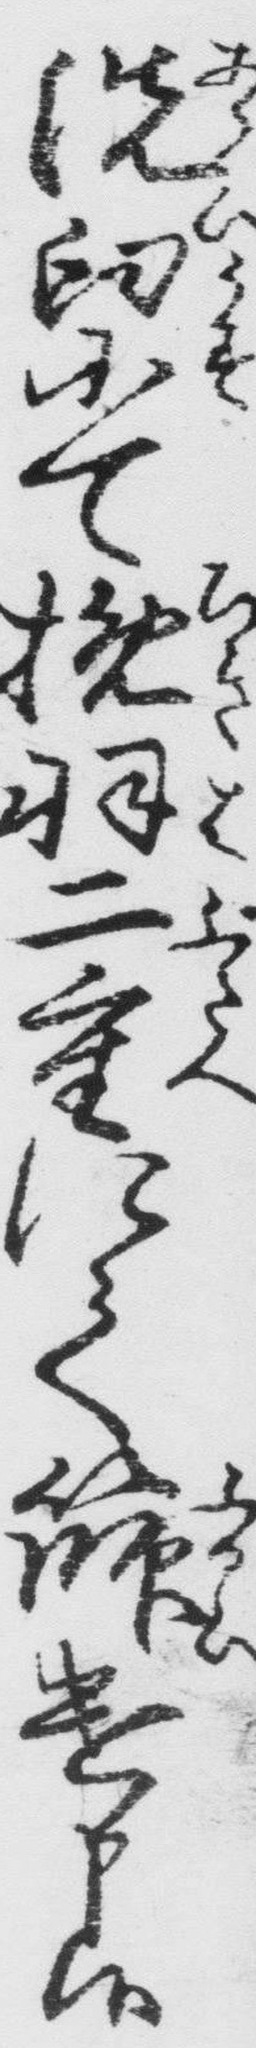洗臼にて挽羽二重にて篩遣申候
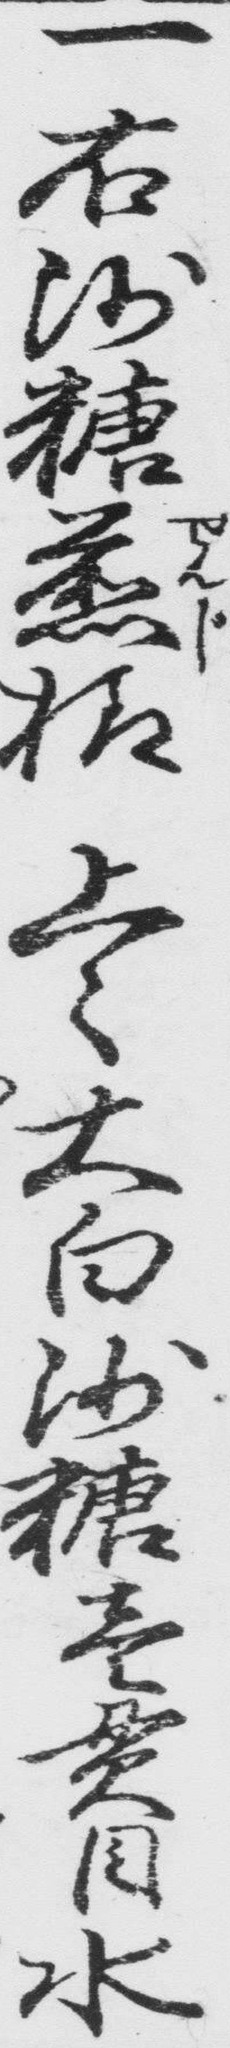一右沙糖煎様上々大白沙糖壱貫目水
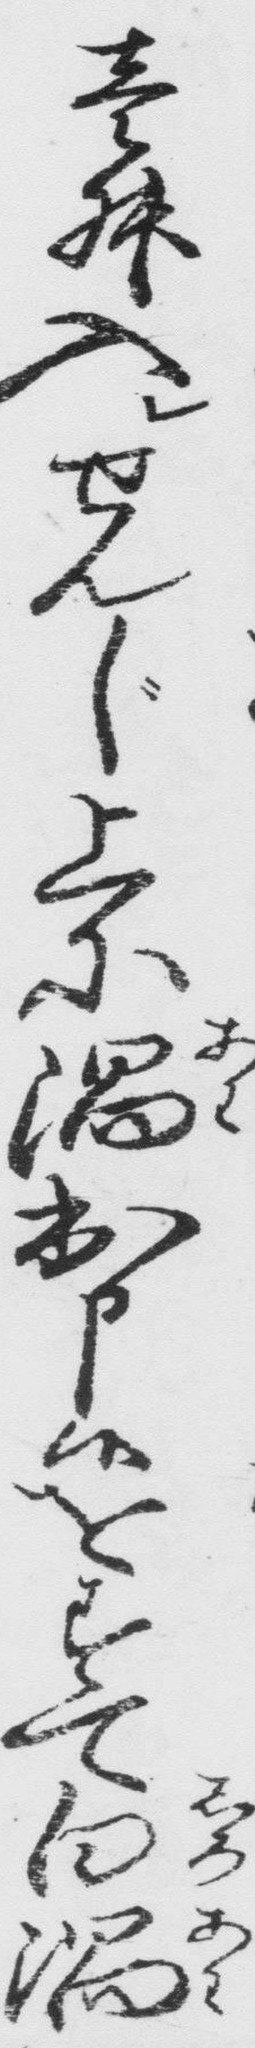壱升入れせんじ上に渦出申候をすて白渦
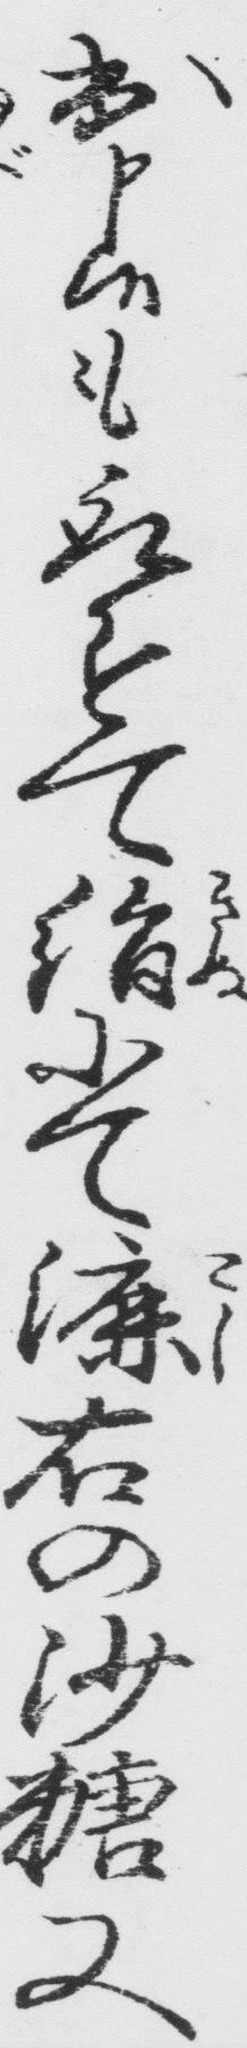出申候も取すて絹にて漉右の沙糖又
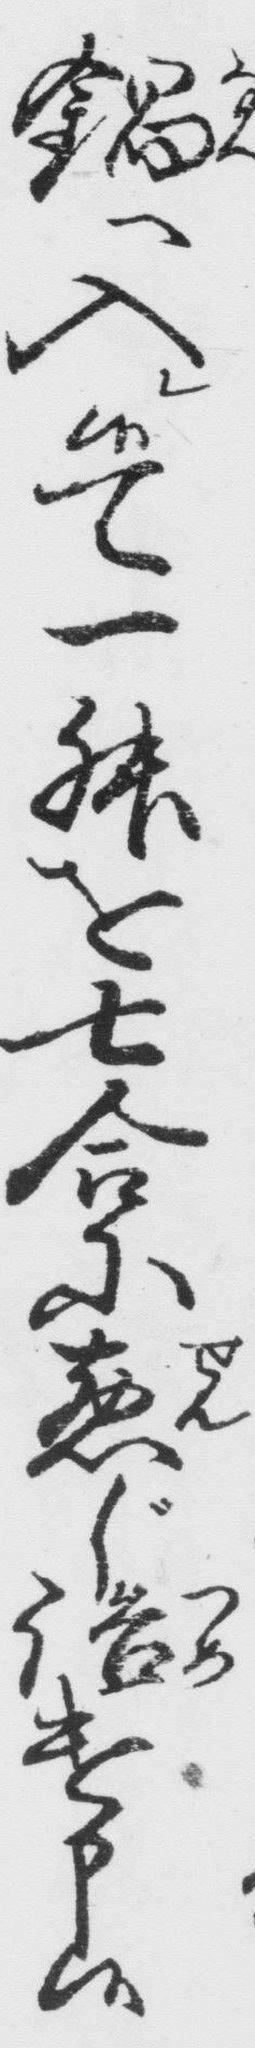鍋へ入れ候て一升を七合に煎じ詰遣申候
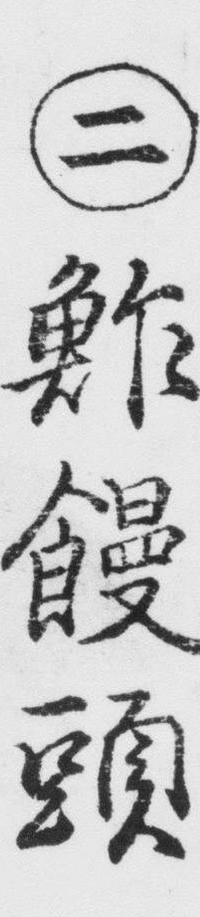(二)鮓饅頭
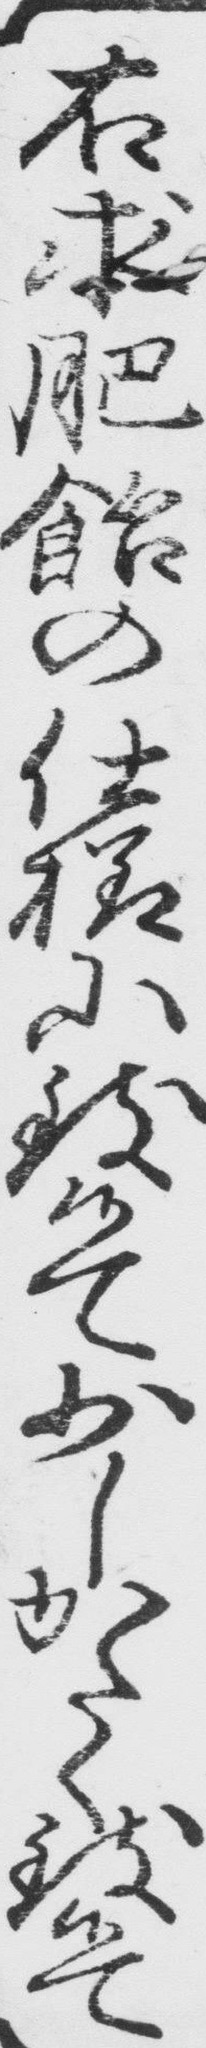右求肥飴の仕様に致候て少しかたく致候て
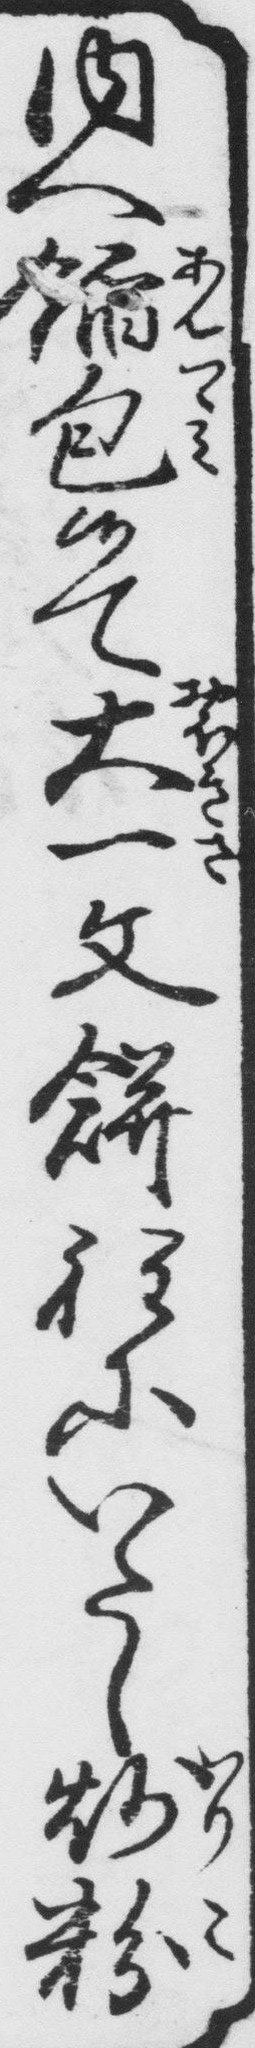内へ餡包候て大一文餅程にいたし炒粉
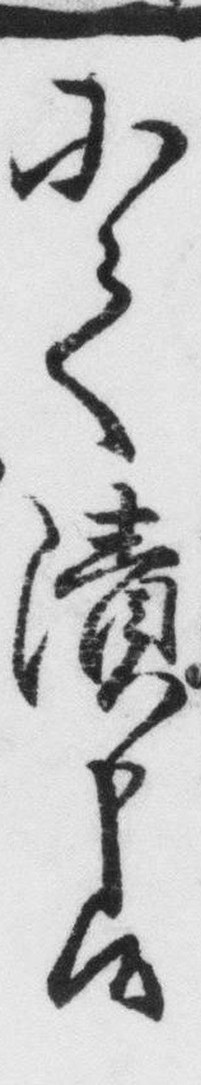にて漬申候
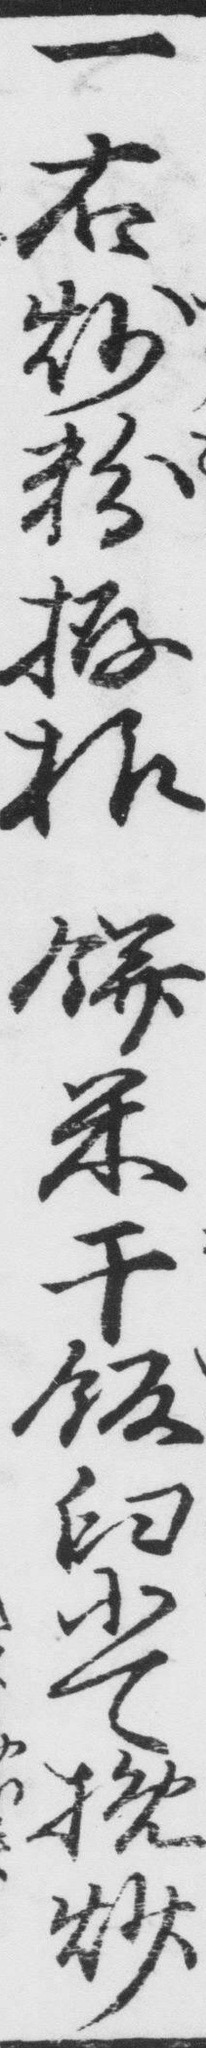一右炒粉拵様餅米干飯臼にて挽炒
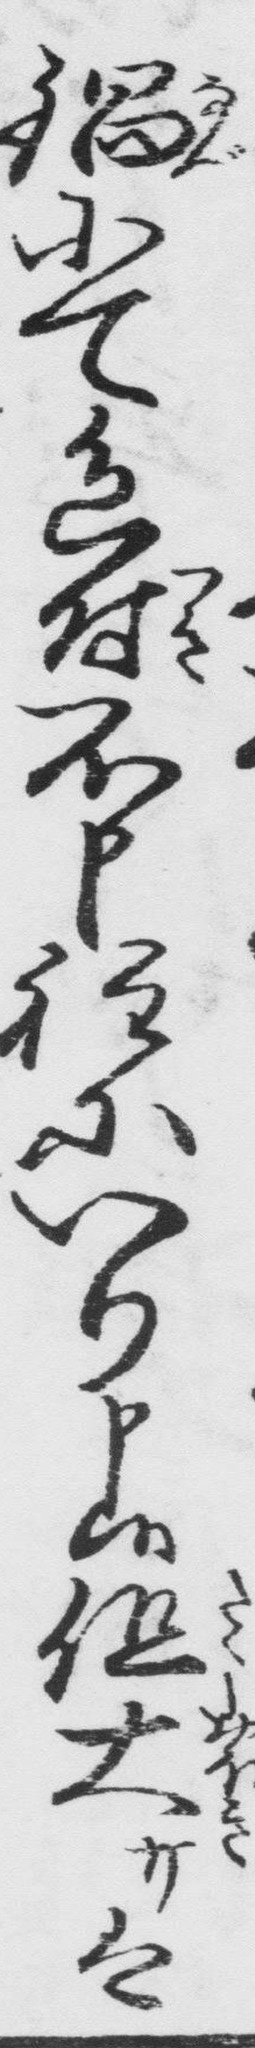鍋にて色付不申程にいり申候但大さは
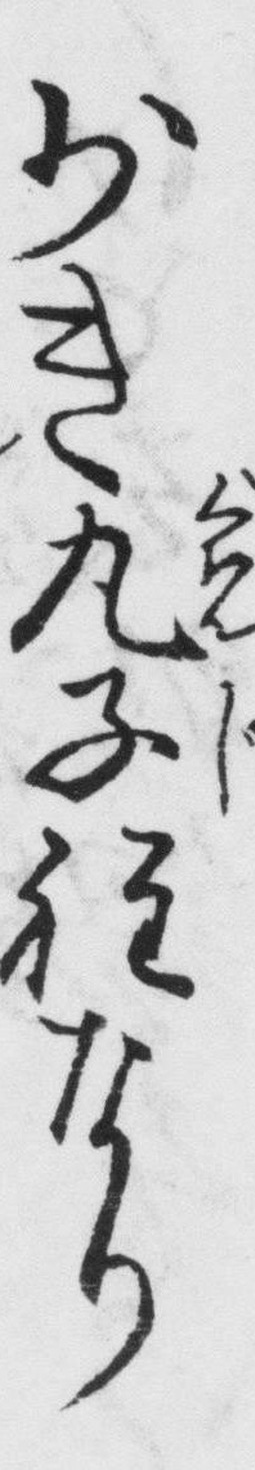少き丸子程なり
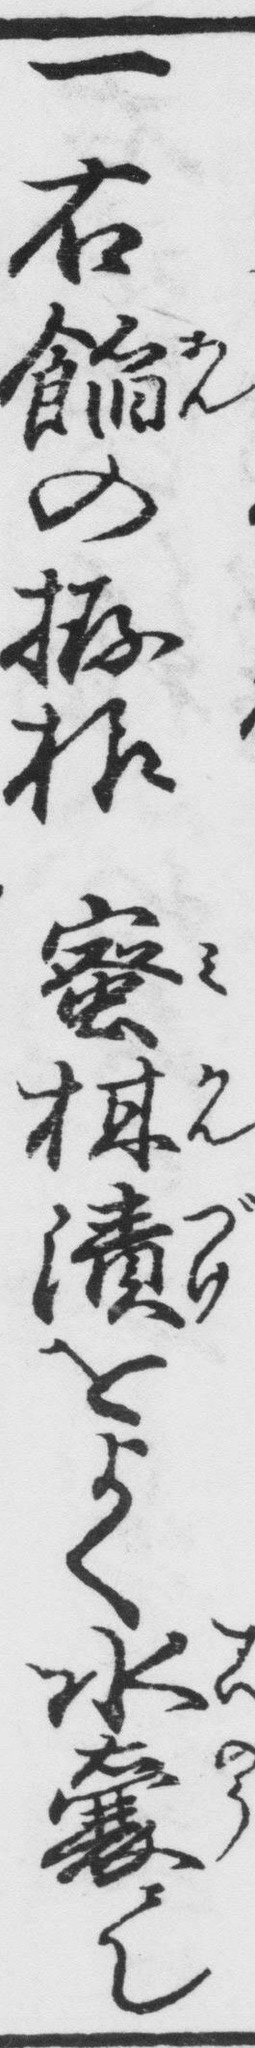一右餡の拵様蜜柑漬をよく水嚢にて
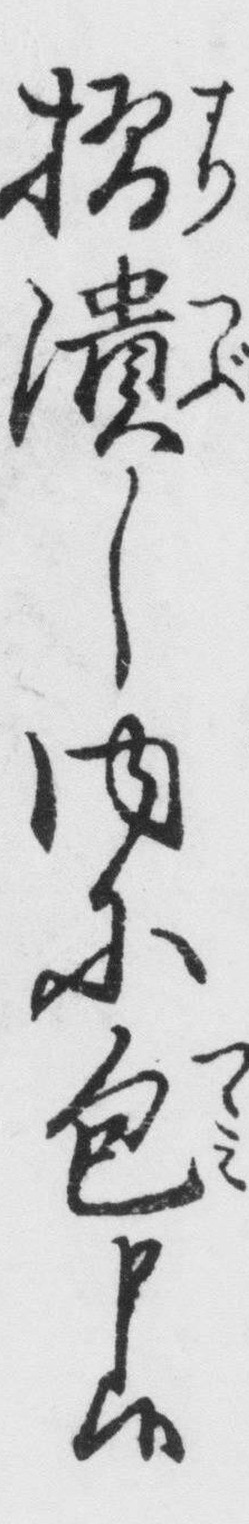摺潰し内に包申候
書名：御前菓子図式
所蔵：大阪府立大学学術情報センター 国文学研究資料館
